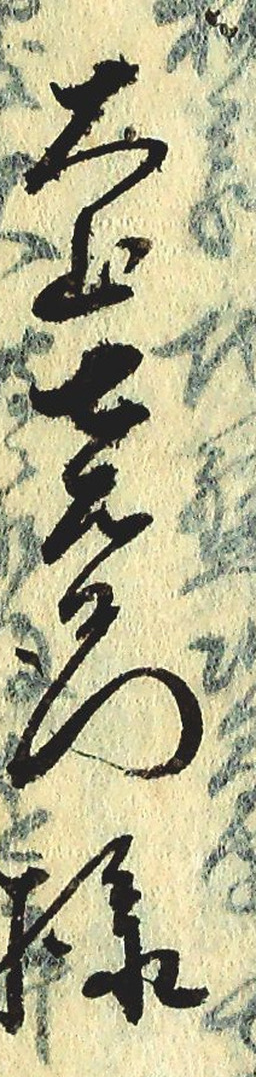大山七右衛門様
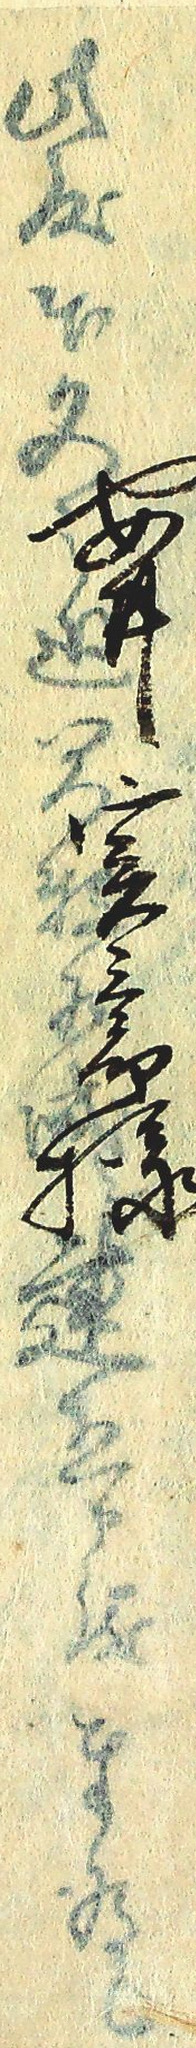安井実三郎様
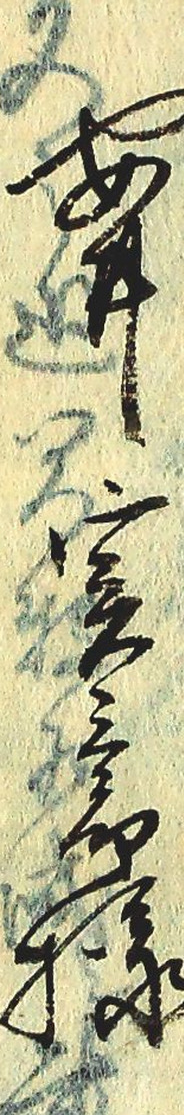安井実三郎様

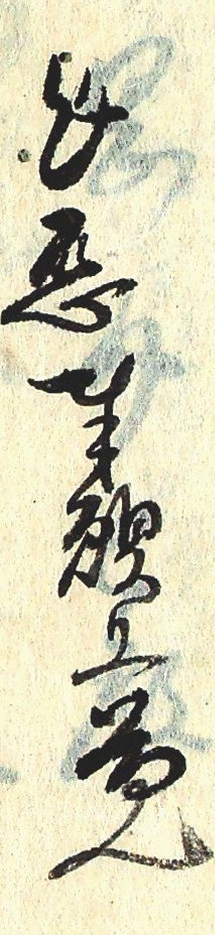乍恐奉願上覚
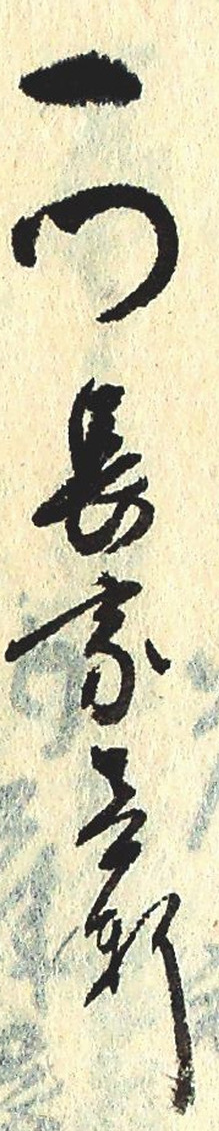一門長家壱軒礎
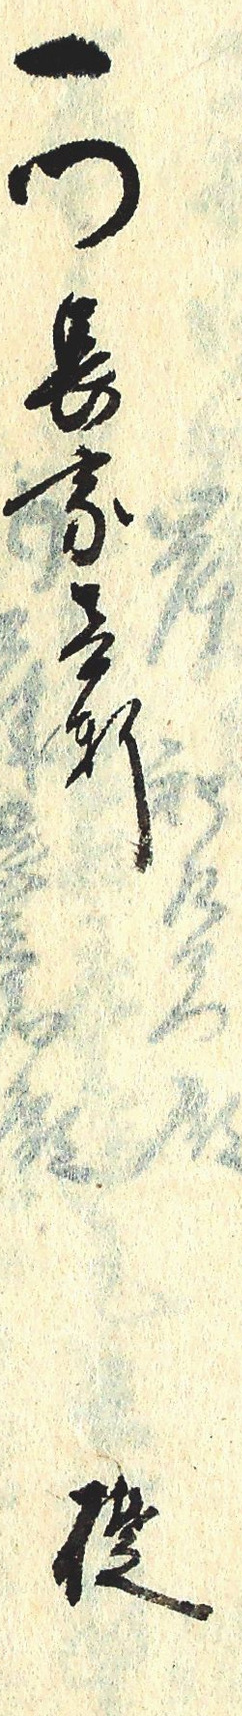一門長家壱軒礎
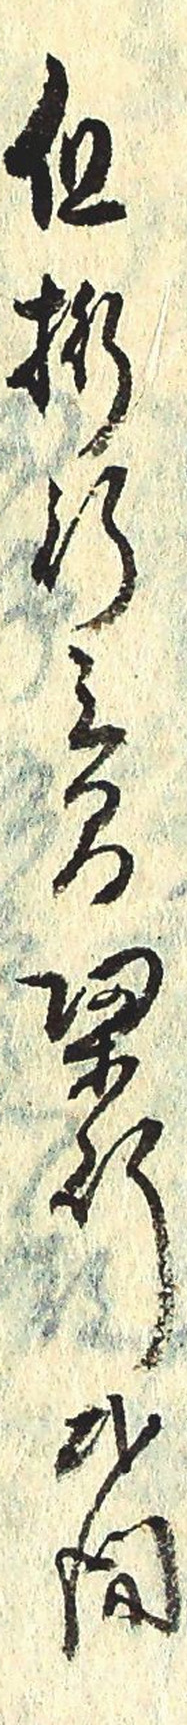但桁行三間梁行弐間
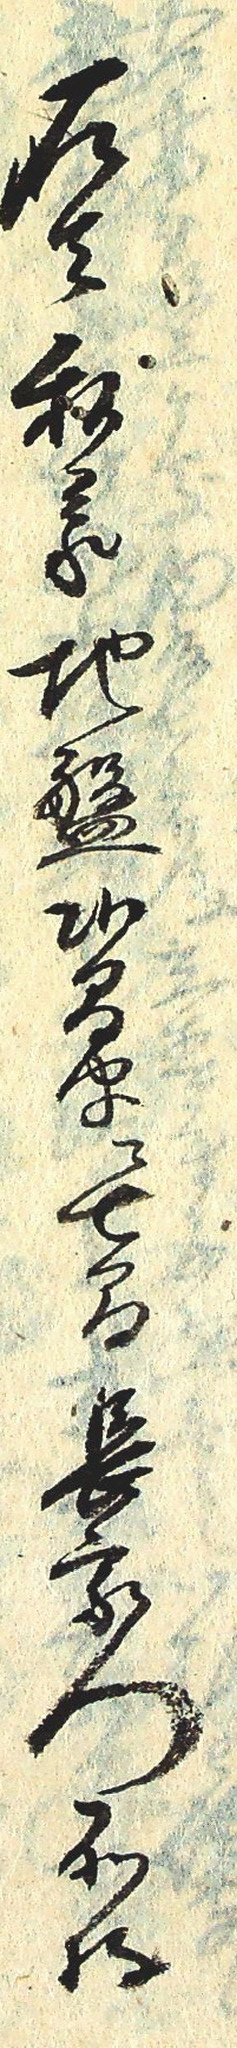右は私義地盤弐間半に七間長家門所持
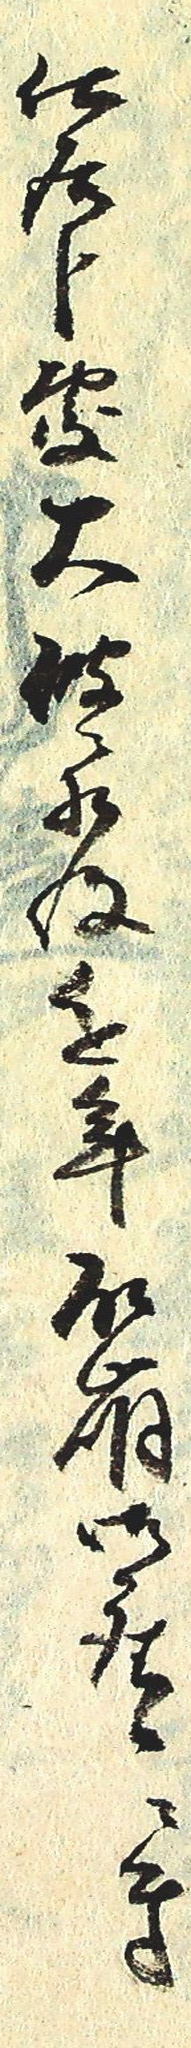仕居申処大破に相及近年取崩御座候に付
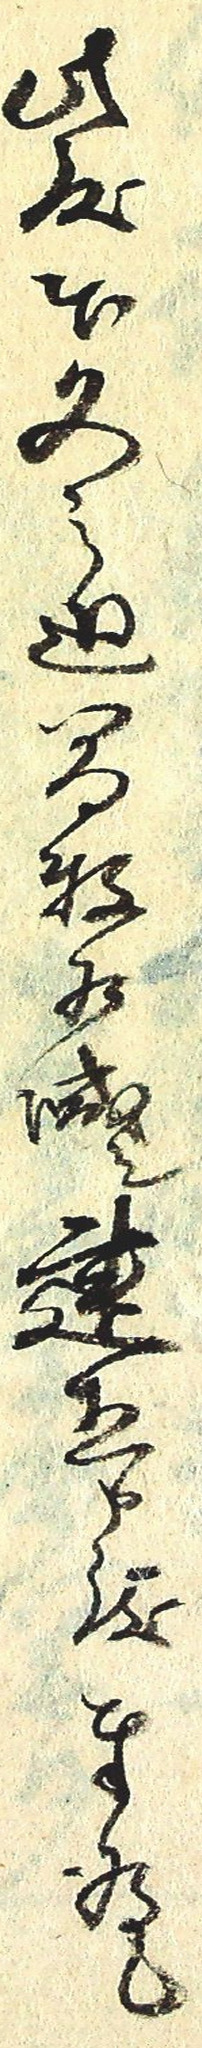此度本文之通間数相減し建直申度奉存候
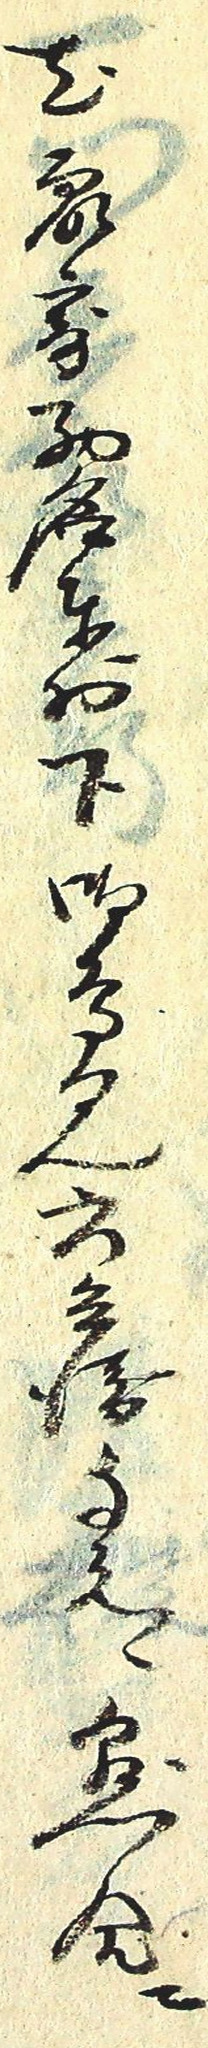尤最寄西名東村下御鳥見六兵衛方元へ懸合に
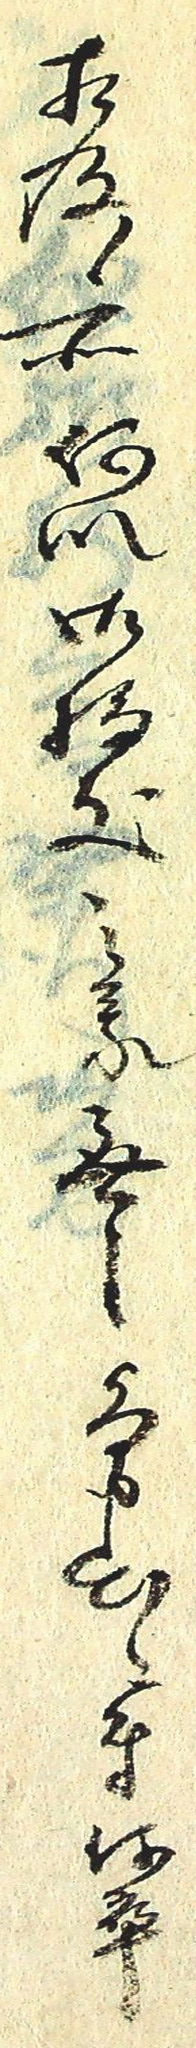相及候所何以御指支之義無之旨申出候付何卒
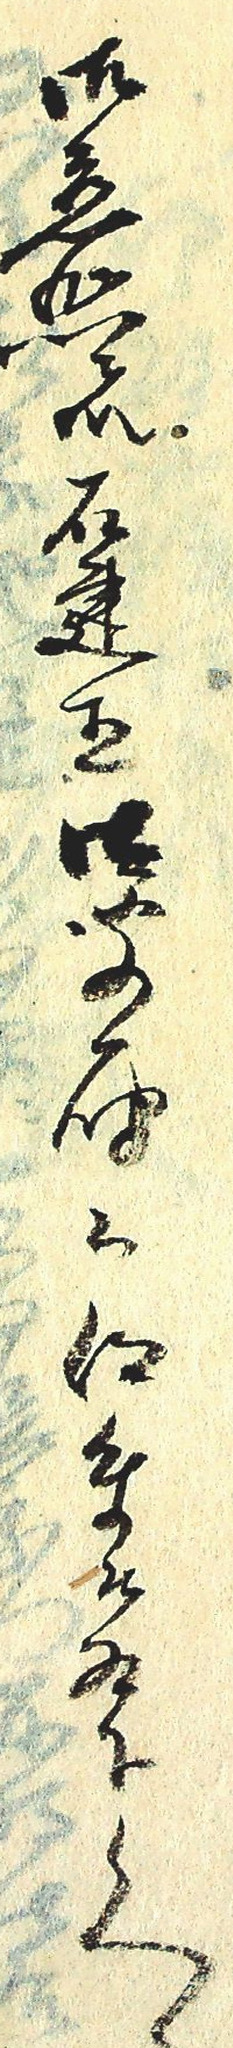御慈悲を以右建直御聞届被仰付被為下候はゝ
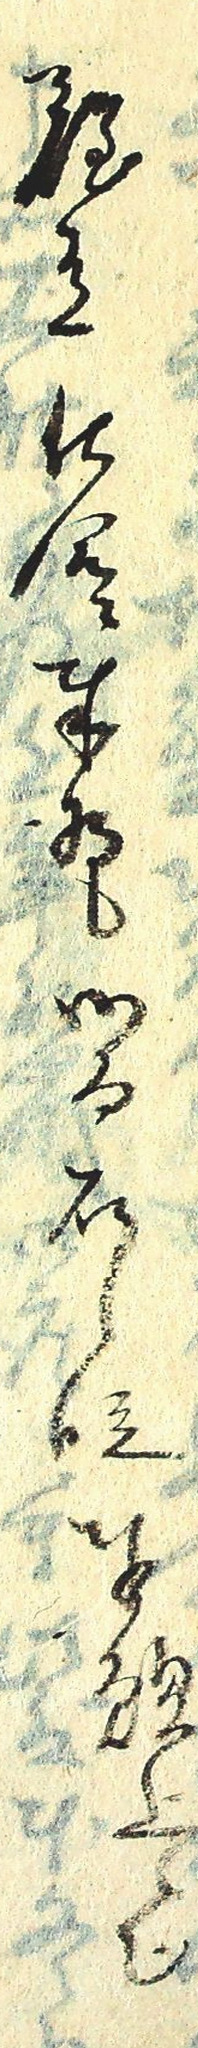難有仕合に奉存候仍て右之段奉願上候以上
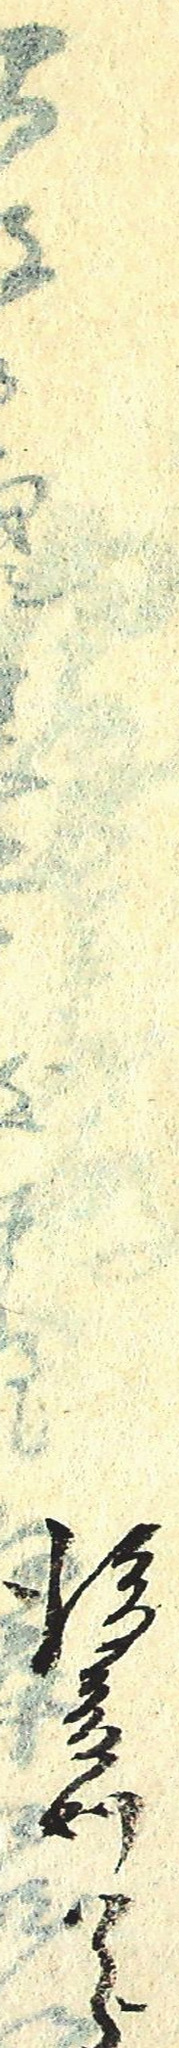後藤利八郎
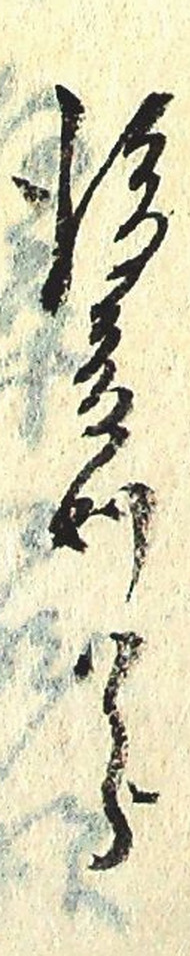後藤利八郎
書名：諸御願書控(弐番）
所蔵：鳴門教育大学 Naruto University of Education
